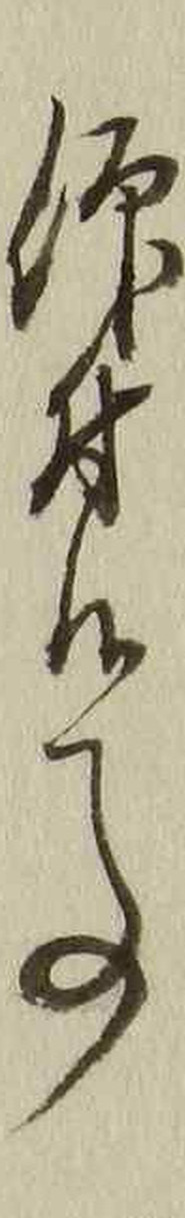仰付候事
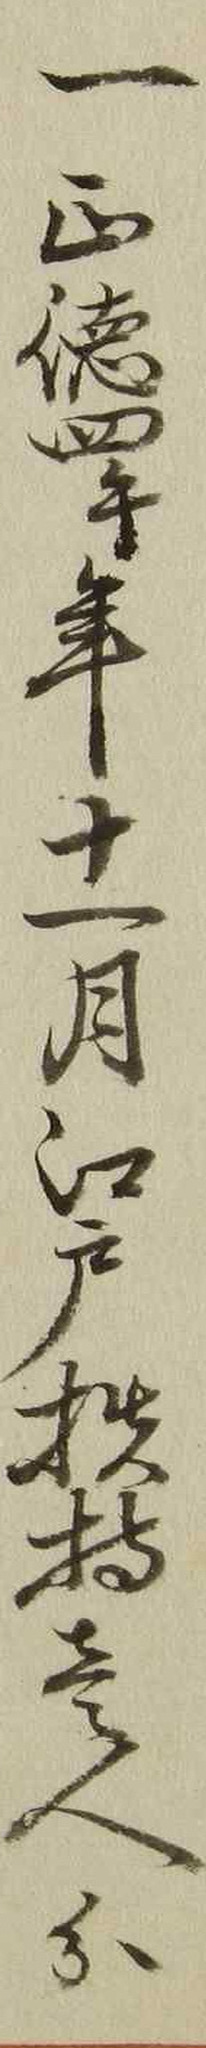一正徳四午年十一月江戸扶持壱人分
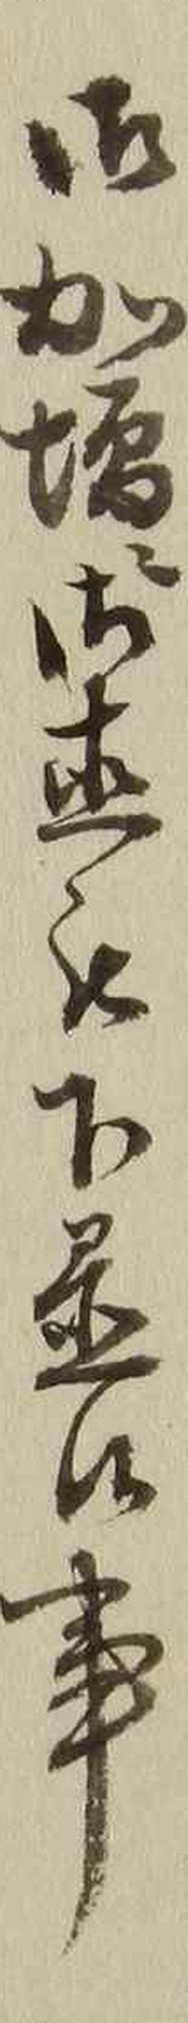御加増ニ御直被下置候事
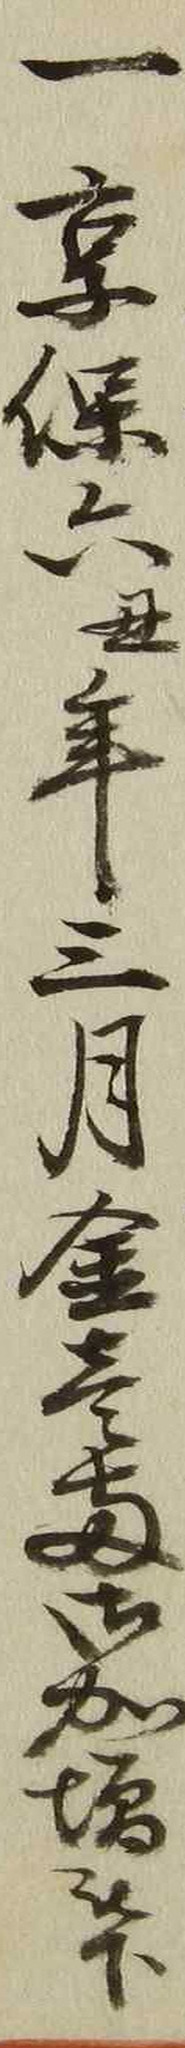一享保六丑年三月金壱両御加増被下
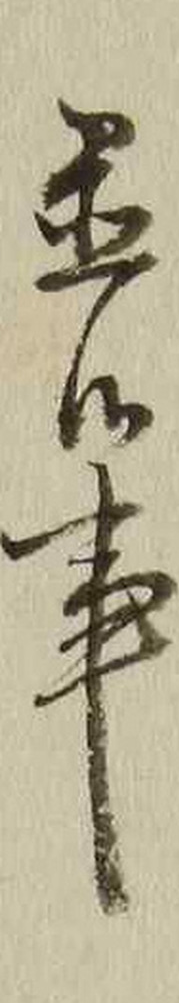置候事
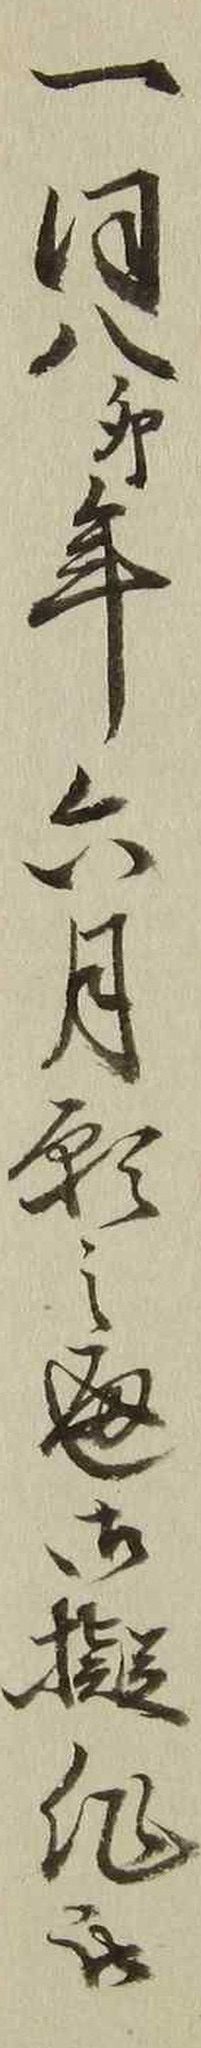一同八卯年六月願之通御擬作被
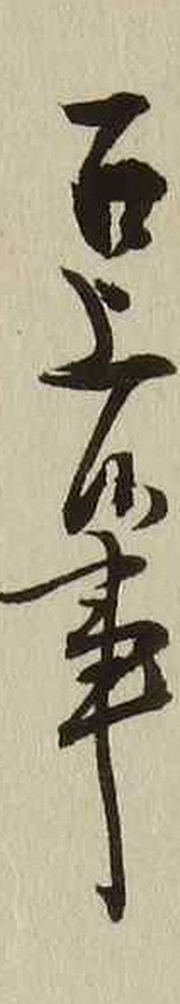召上候事
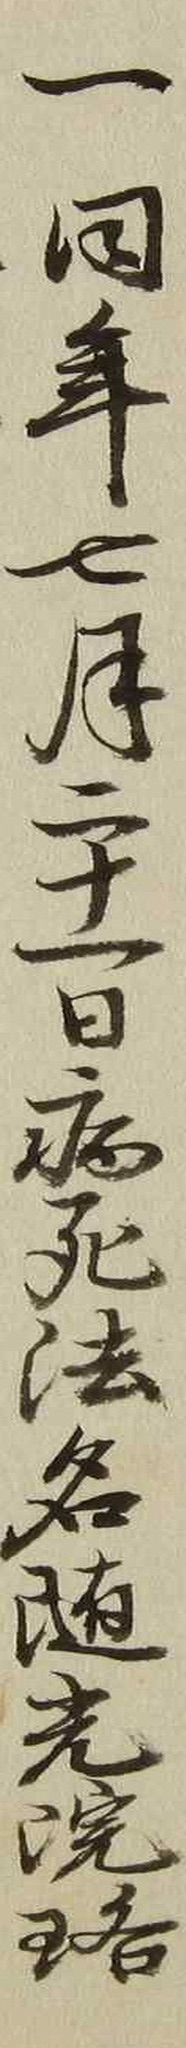一同年七月二十一日病死法名随光院珞
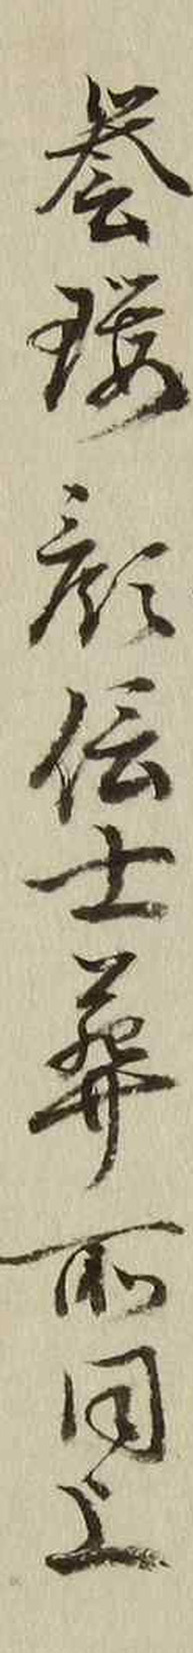誉桜顔信士葬所同上
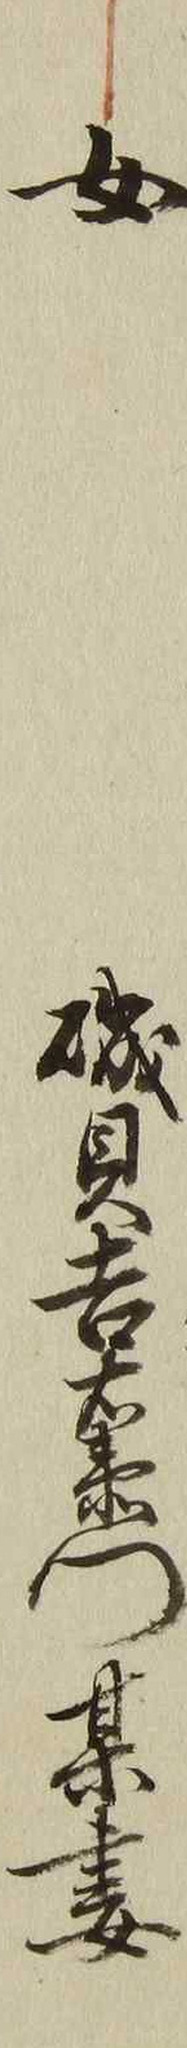女磯貝吉右衛門某妻
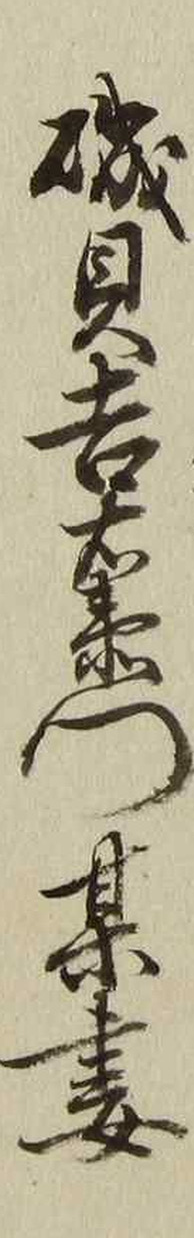女磯貝吉右衛門某妻
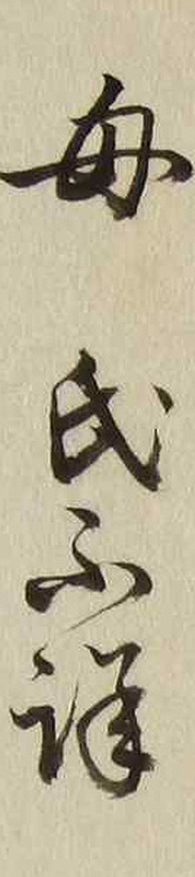母氏不詳
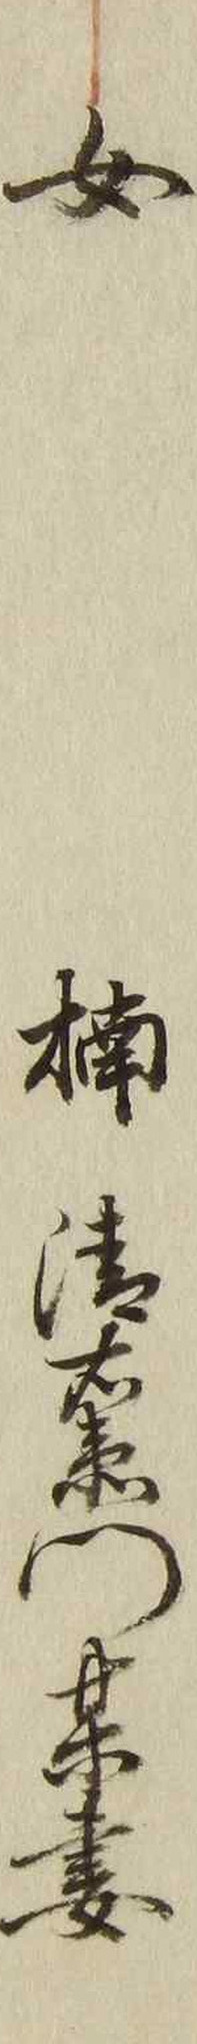女楠清右衛門某妻
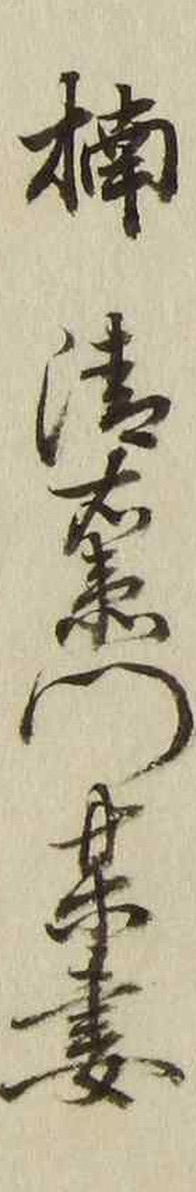女楠清右衛門某妻

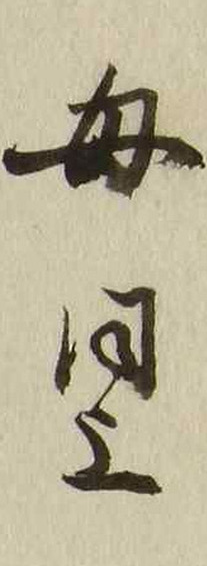母同上
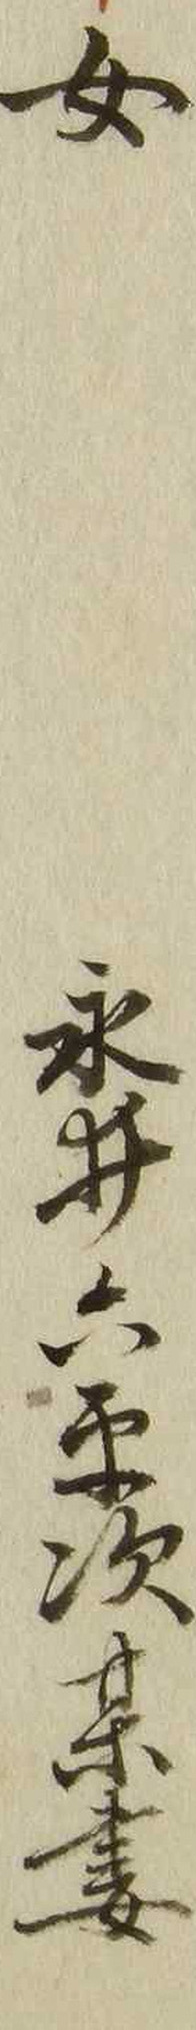女永井六平次某妻
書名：諸士系譜　巻之53　に之部4
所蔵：会津若松市立会津図書館
